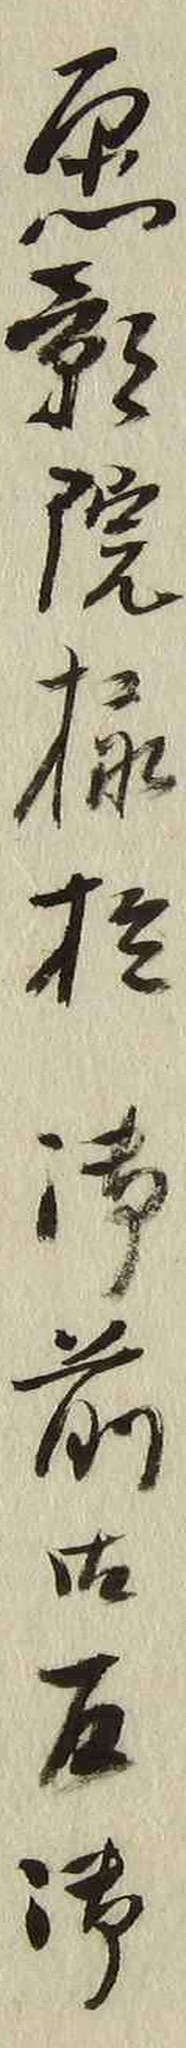愿彰院様於御前御召御
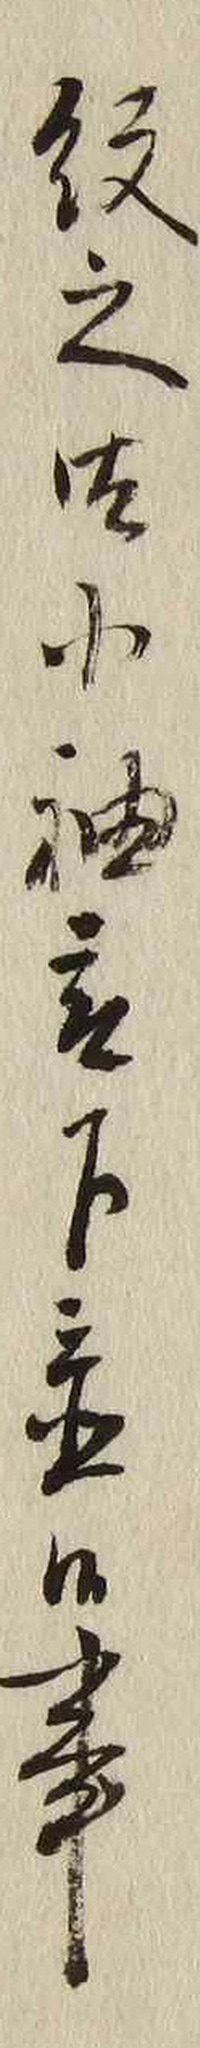紋之御小袖被下置候事
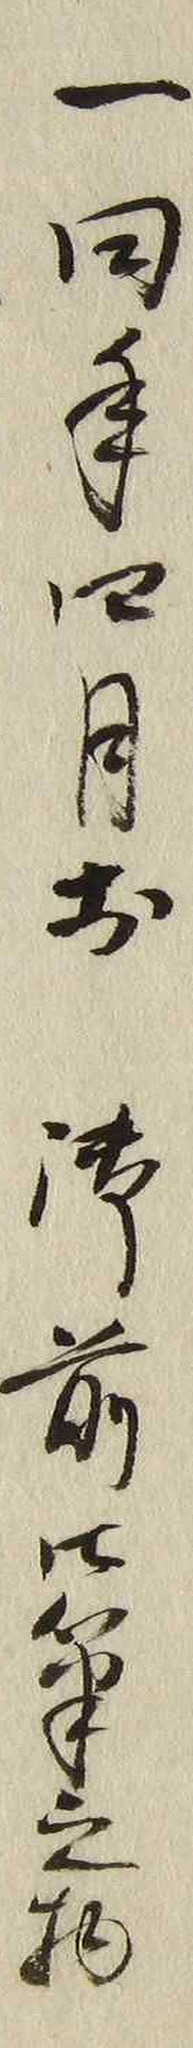一同年四月於御前御筆之物
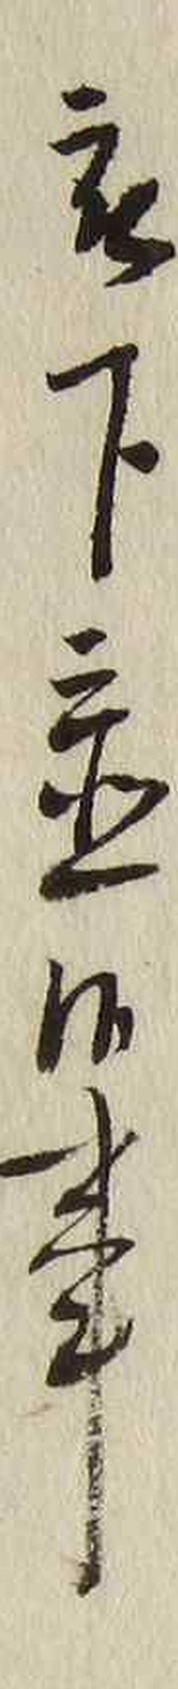被下置候事
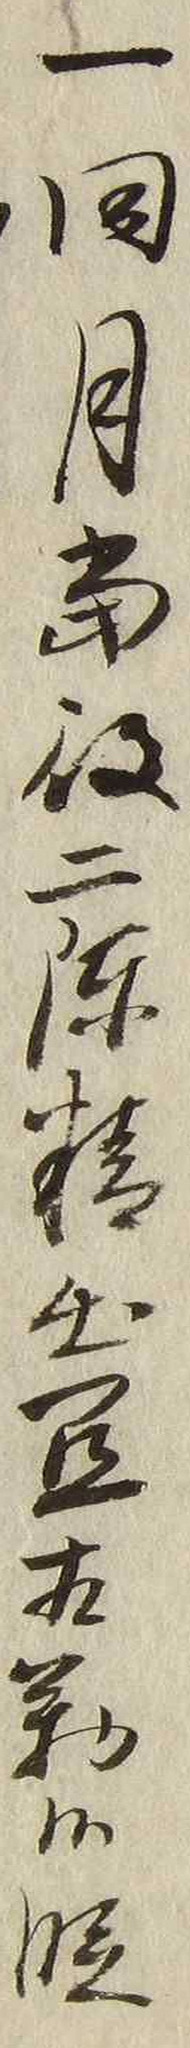一同月当役二陣精出宜相勤候段
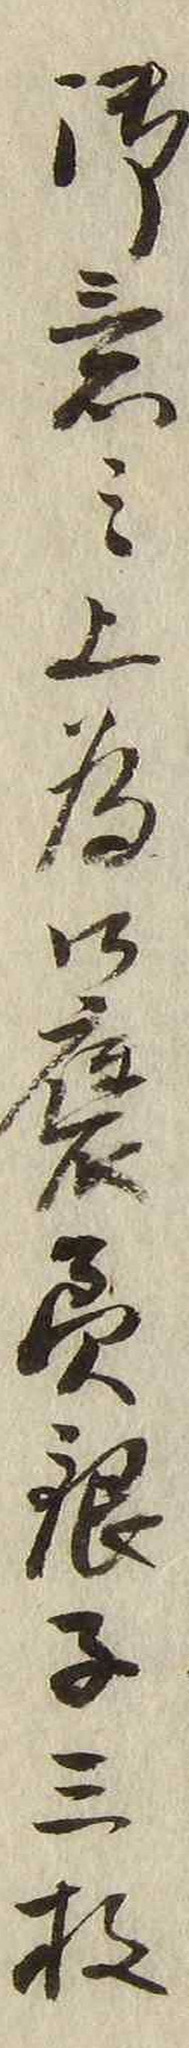御意之上為御褒美銀子三枚

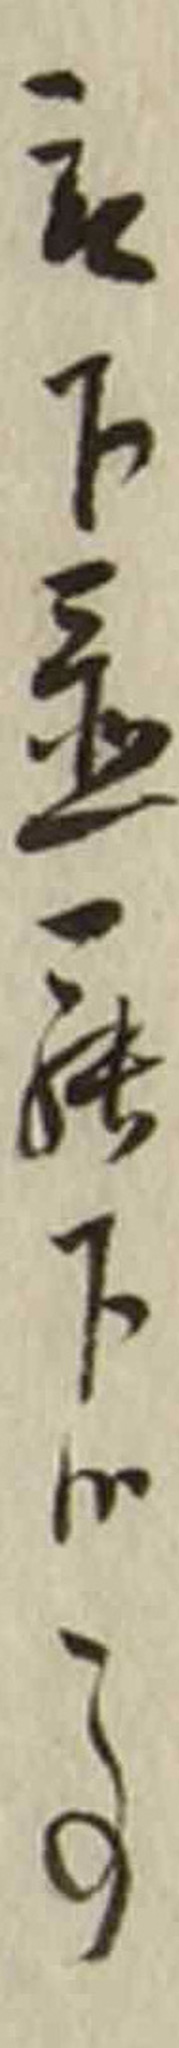被下置罷下候事
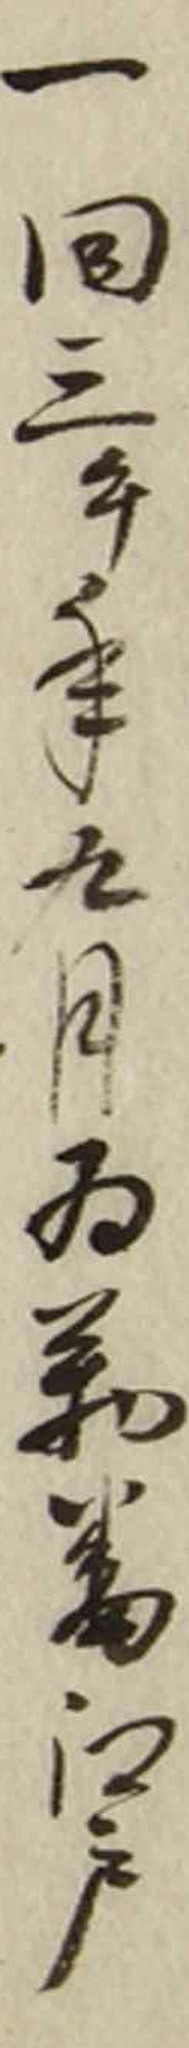一同三午年九月為勤番江戸
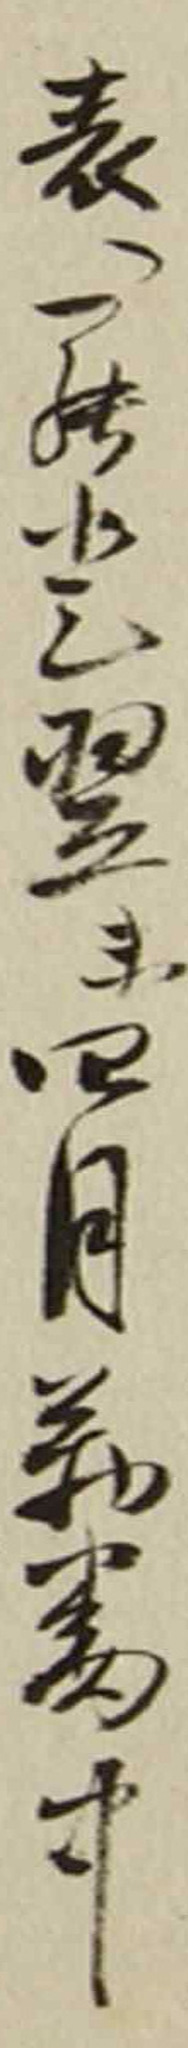表へ罷登翌未四月勤番中
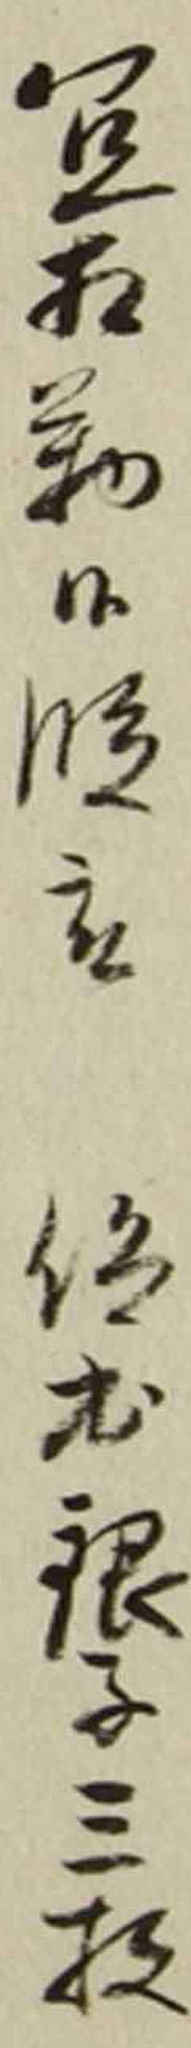宜相勤候段被仰出銀子三枚
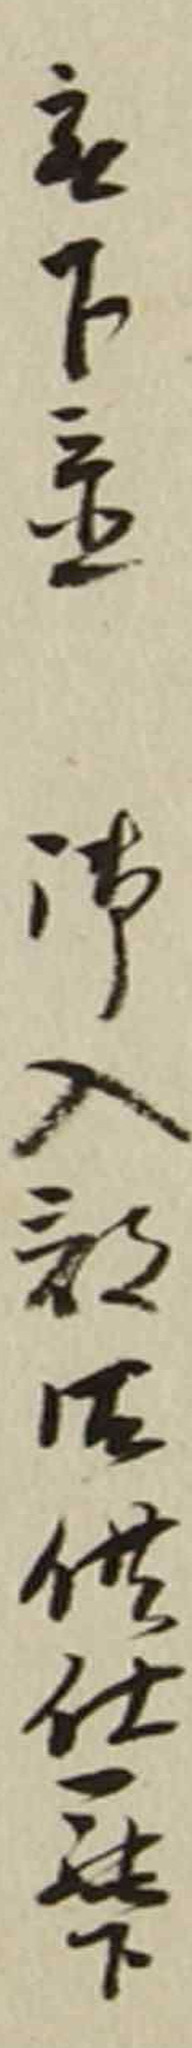被下置御入部御供仕罷下
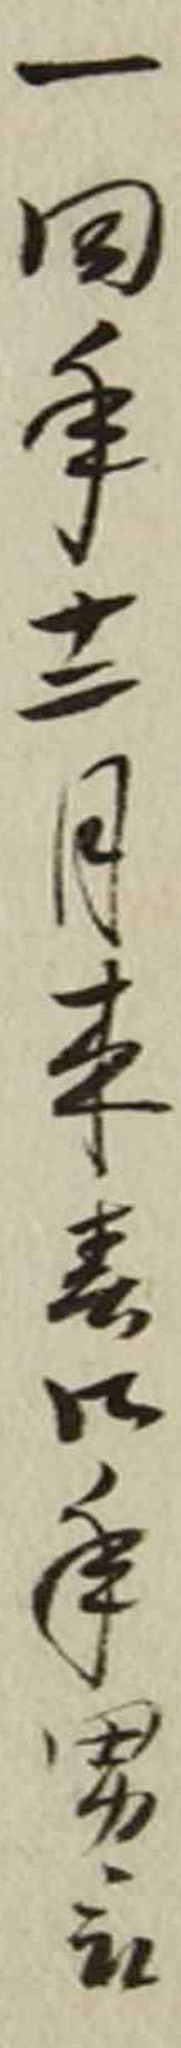一同年十二月来春御年男被
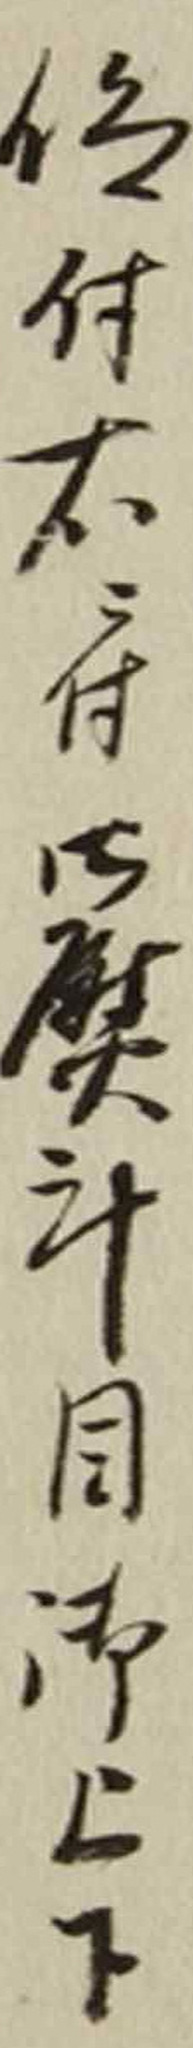仰付右ニ付御熨斗目御上下
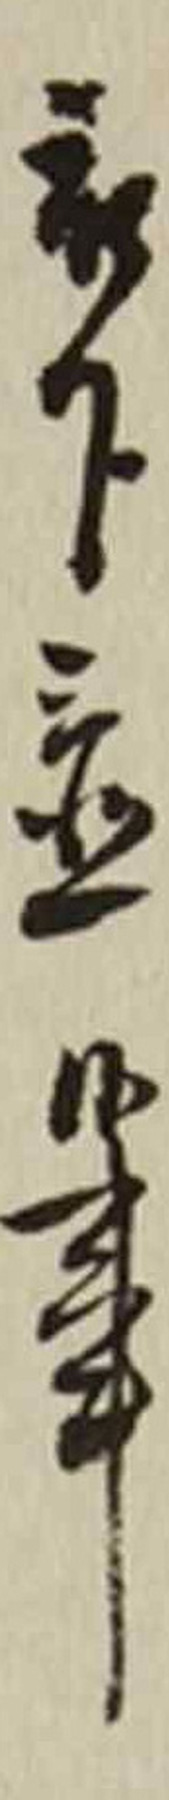被下置候事
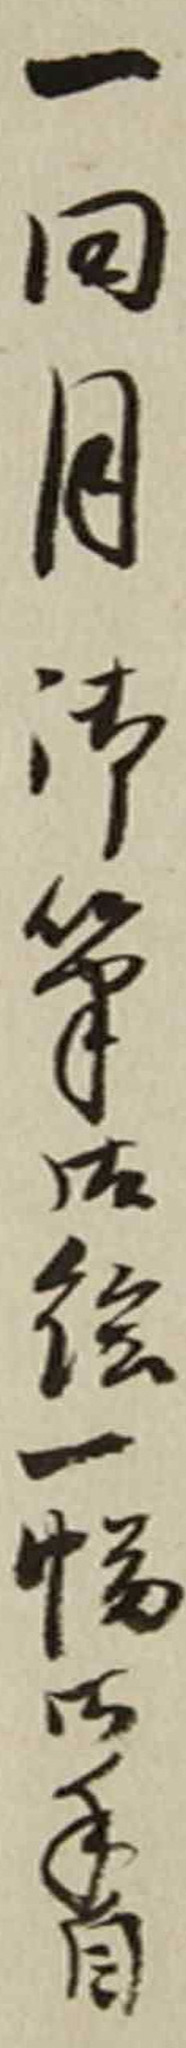一同月御筆御絵一幅御手自
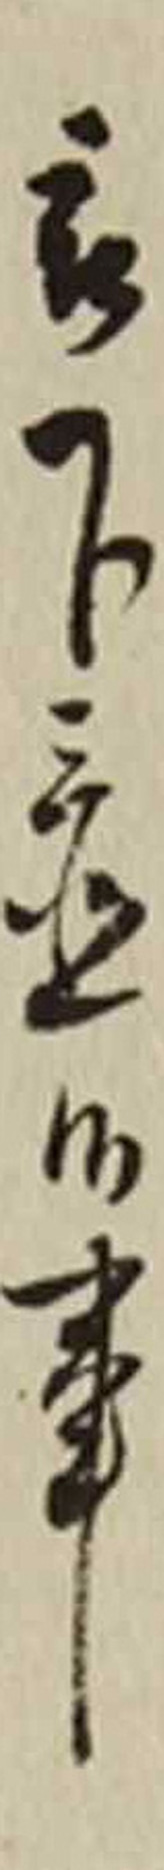被下置候事
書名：諸士系譜　巻之355　す之部5
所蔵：会津若松市立会津図書館
